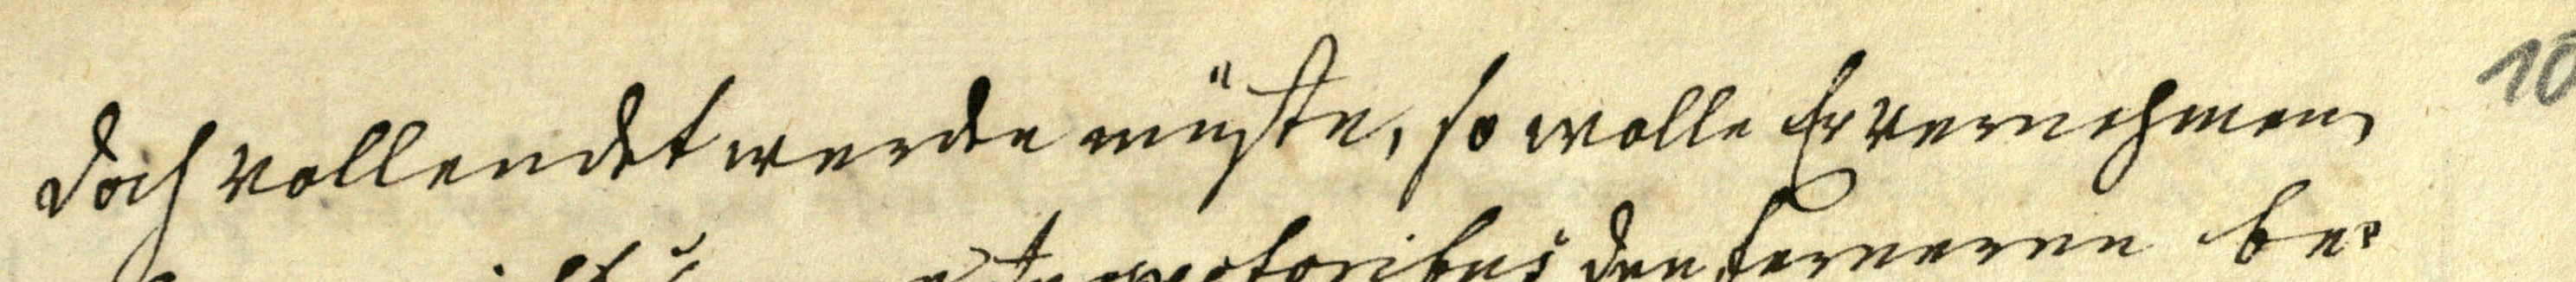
doch vollendet werden müste, so wolle Er vernehmen,
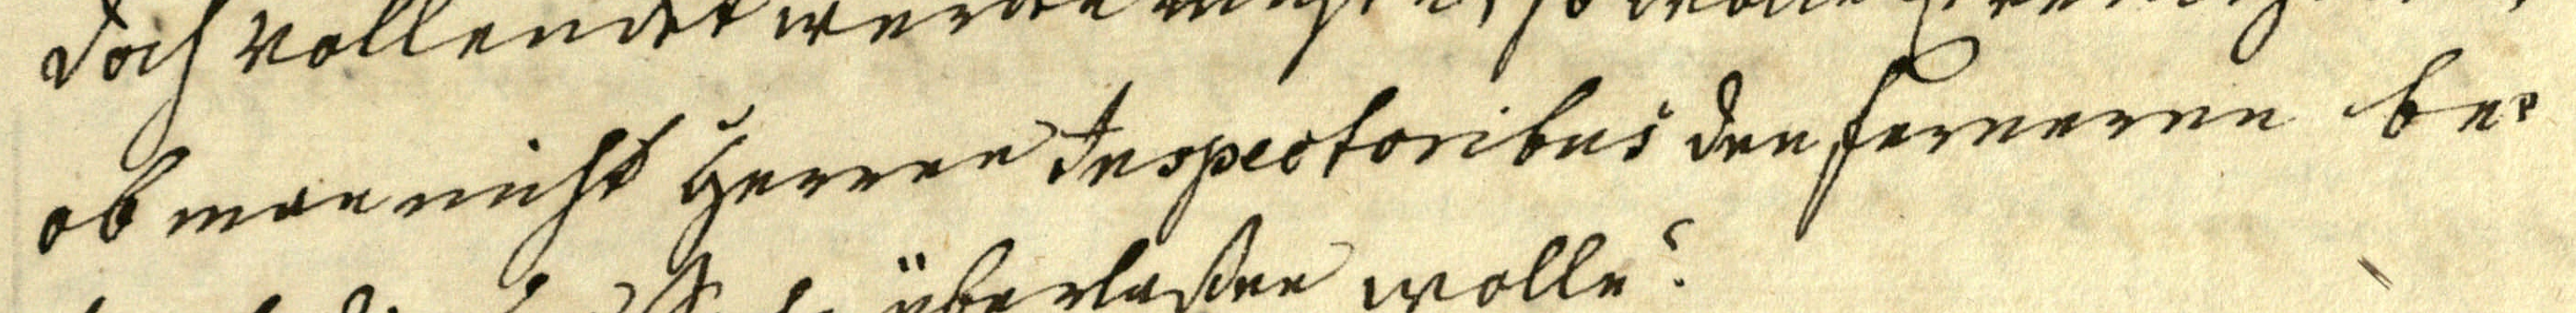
ob man nicht Herren Inspectoribus den ferneren Be¬
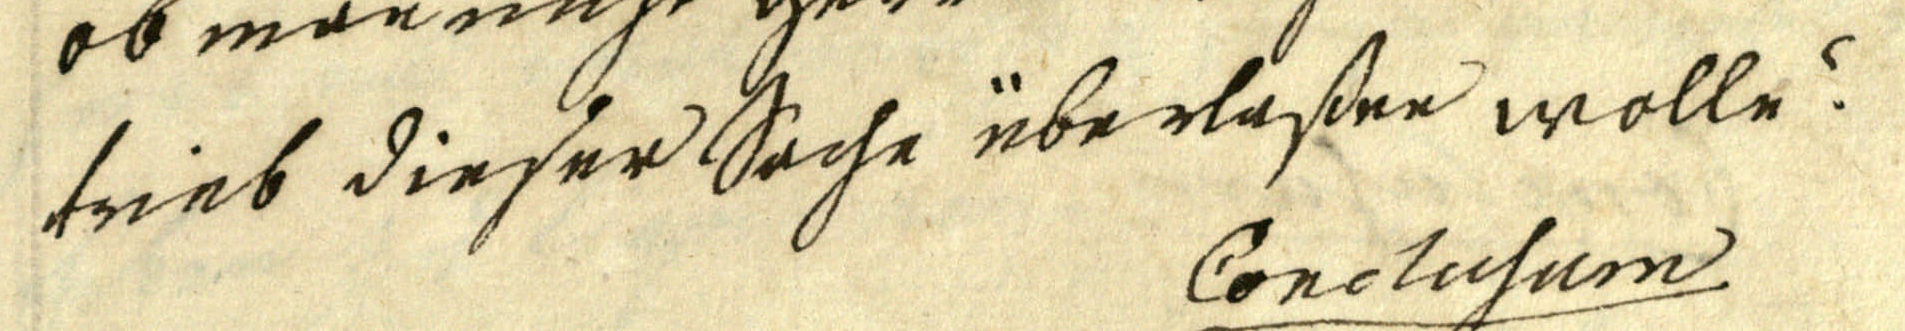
trieb dieser Sache überlassen wolle?
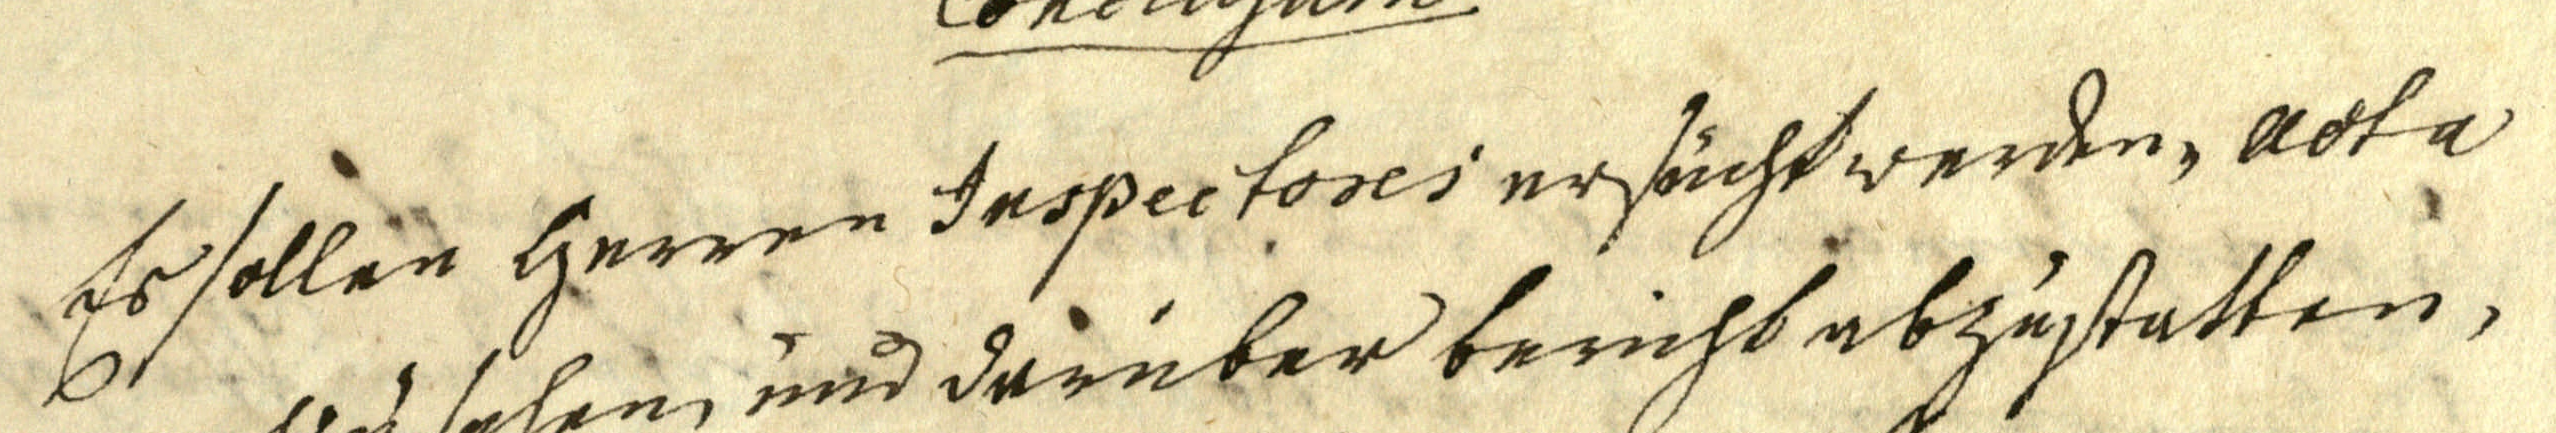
Es sollen Herren Inspectores ersucht werden, Acta
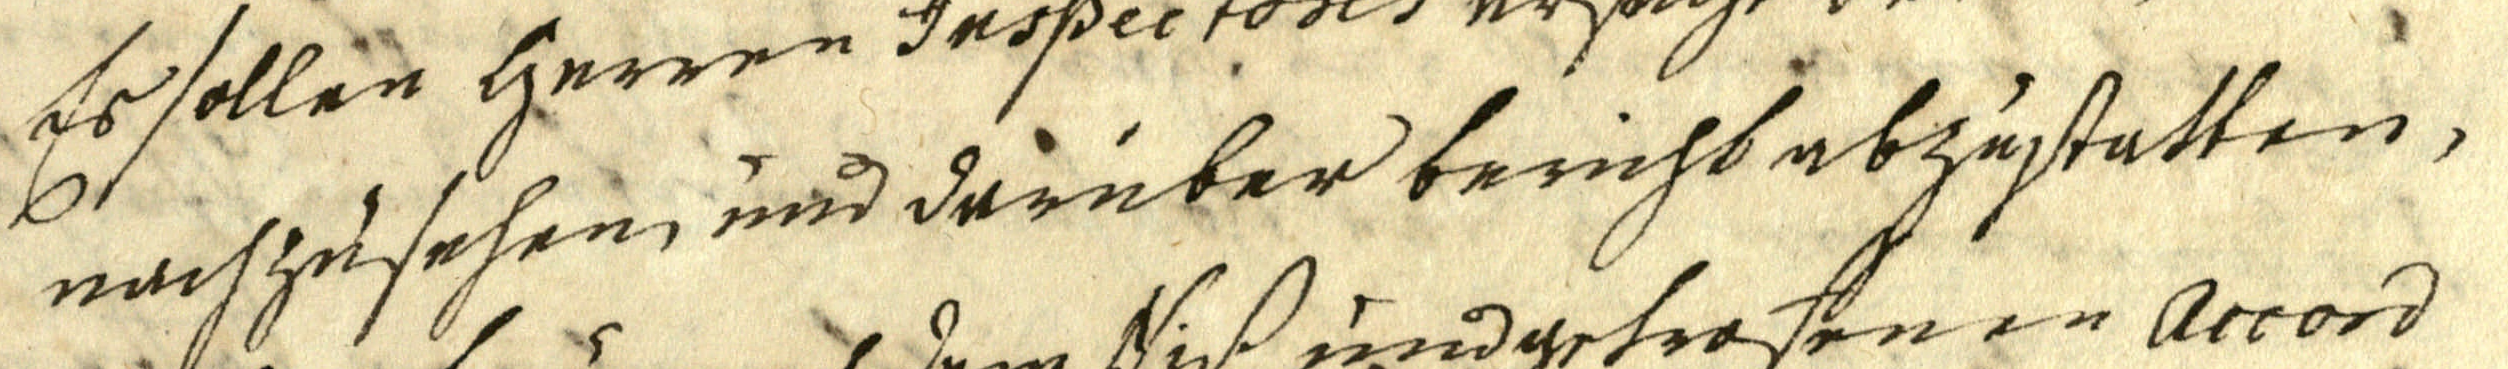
nachzusehen, und darüber Bericht abzustatten,
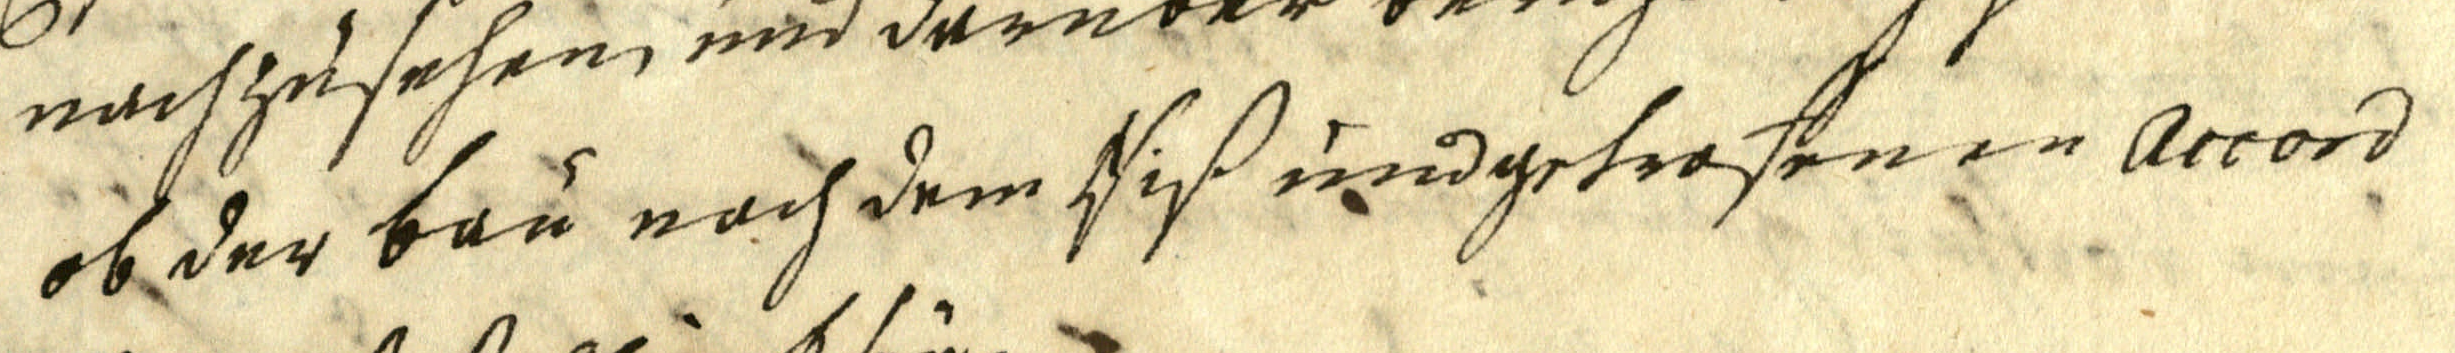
ob der Bau nach dem Riß nd getroffenen Accord
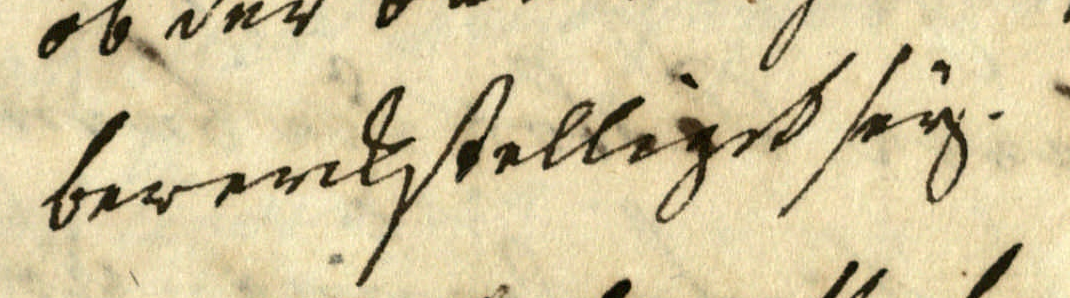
bewerkstelliget seÿ.
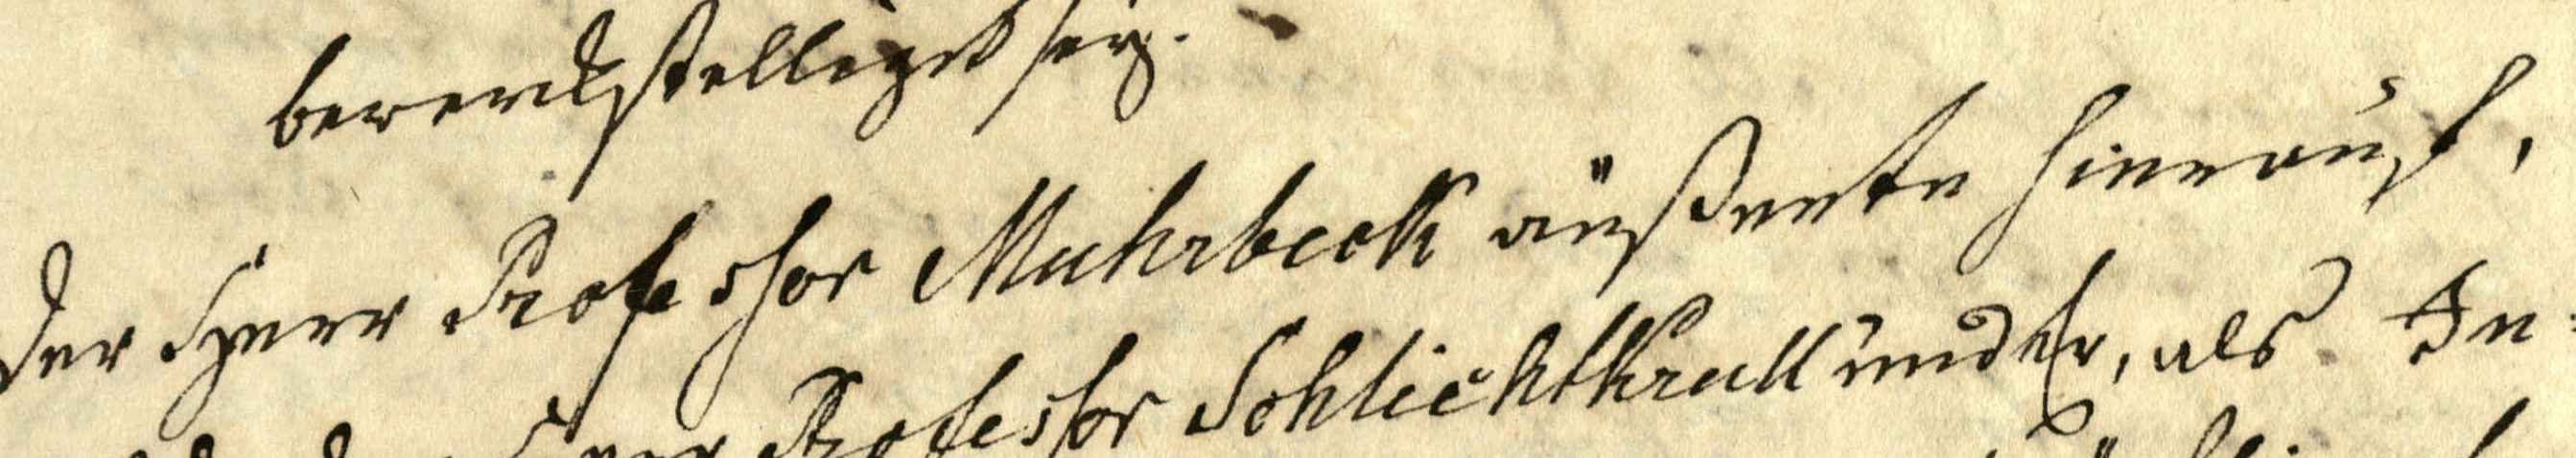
Der Herr Professor Muhrbeck äußerte hierauf,
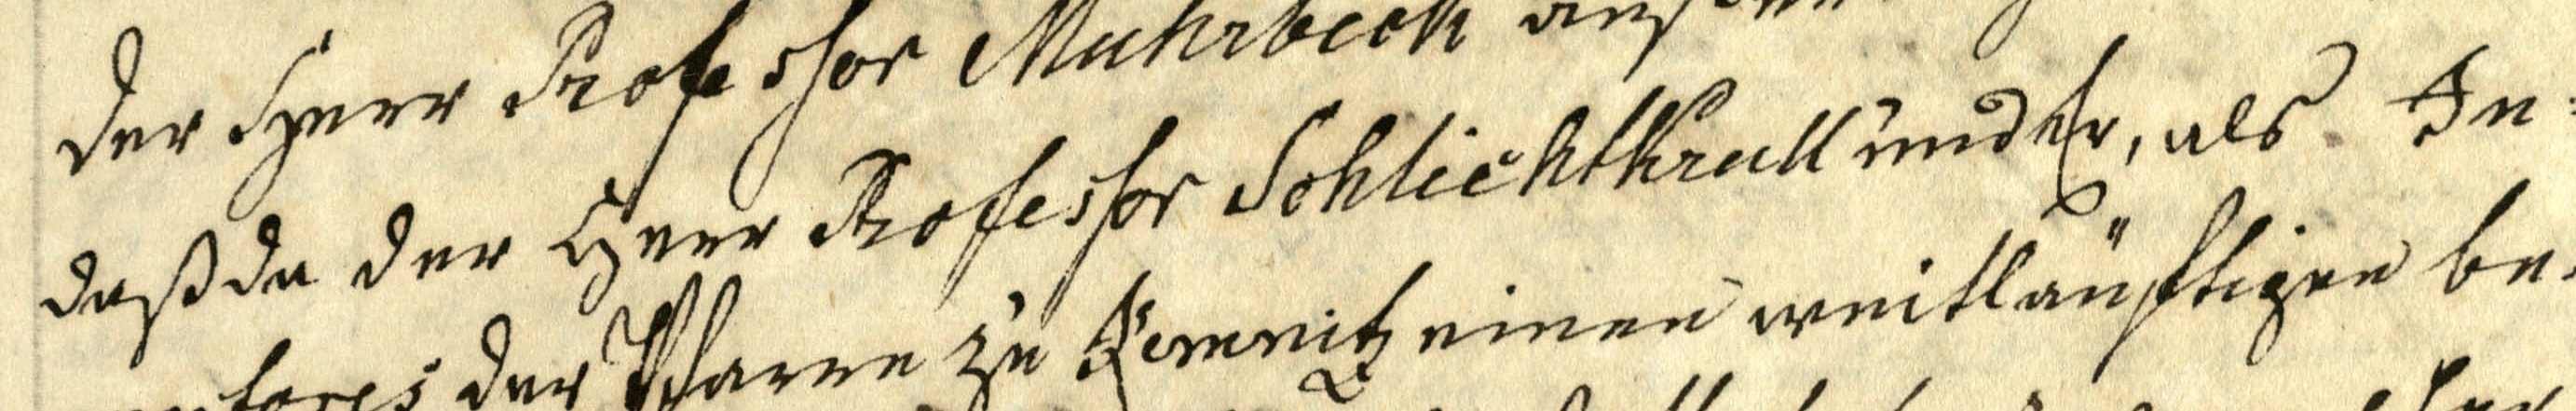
daß da der Herr Professor Schlichtkrull und Er, als In¬
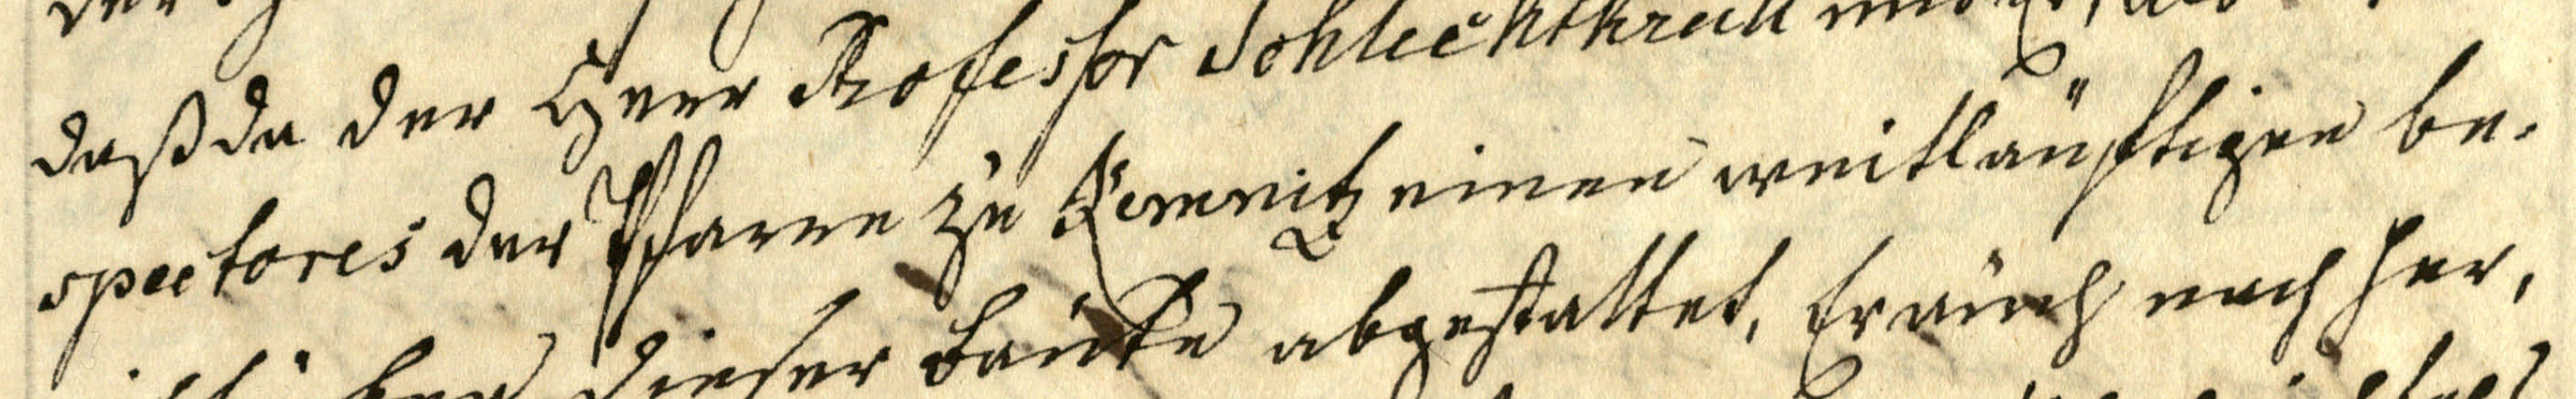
spectores der Pfarre zu Kemnitz einen weitläuftigen Be¬
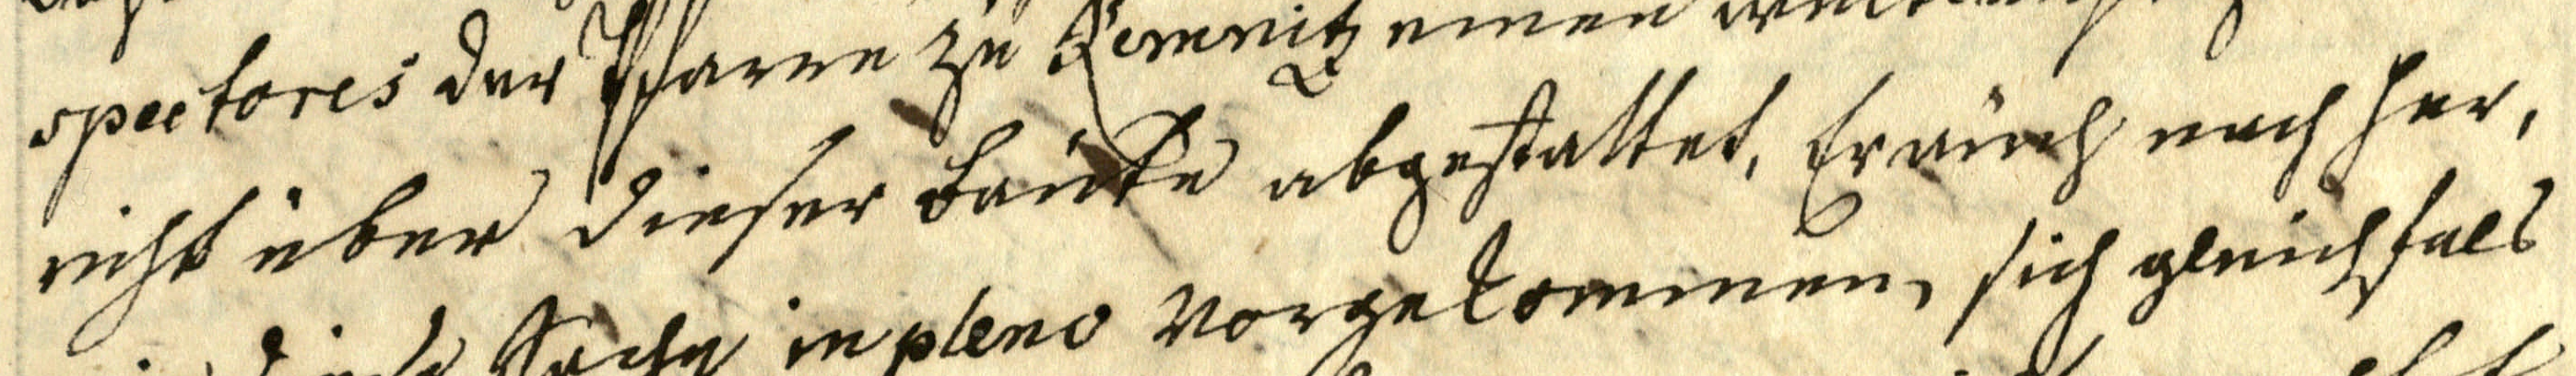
richt über dieser Baute abgestattet, Er auch nach her,
